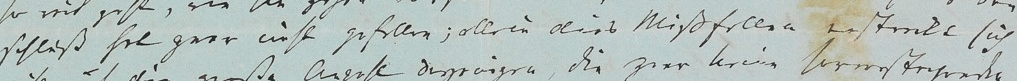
schluß hat zwar nicht gefallen; allein dies Mißfallen erstreckt sich
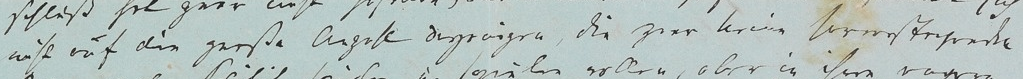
nicht auf die große Anzahl derjenigen, die zwar keine hervorstechenden
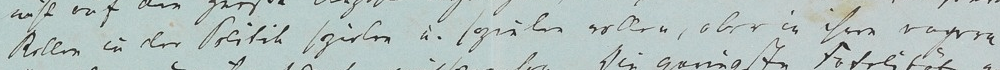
Rollen in der Politik spielen u. spielen wollen, aber in ihren engern
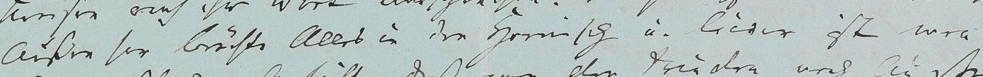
Außen her brächte Alles in den Harnisch u. leider ist man
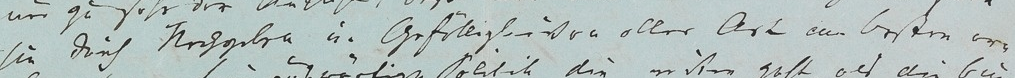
hin durch Nachgeben u. Gefälligkeiten aller Art am besten er-
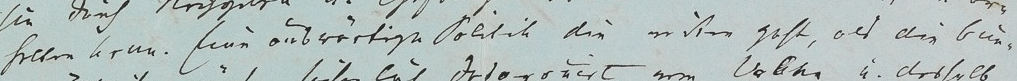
halten kann. Eine auswärtige Politik die weiter geht, als die bun-
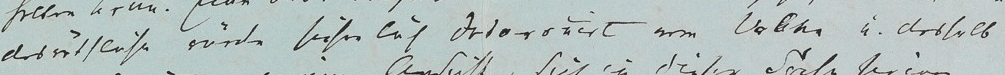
desräthliche würde sicherlich desavouirt vom Volke u. deshalb
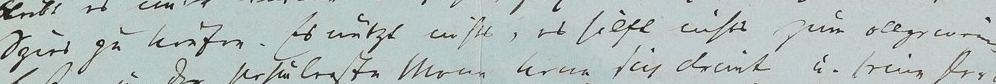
Spies zu kaufen. Es nützt nichts, es hilft nichts zum allgemeinen
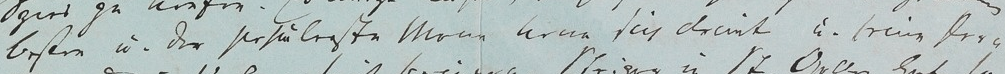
Bestenu. der populärste Mann kann sich damit u. seine Par-
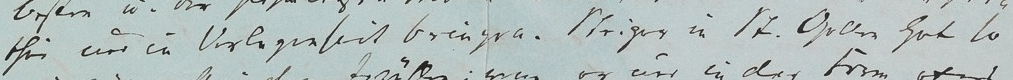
thei nur in Verlegenheit bringen. Steiger in St. Gallen hat so
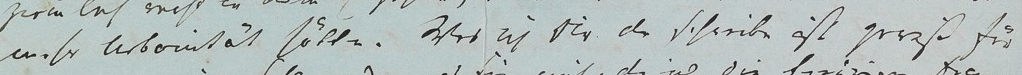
mehr Urbanität hätte. Was ich Dir da schreibe ist gewiß für
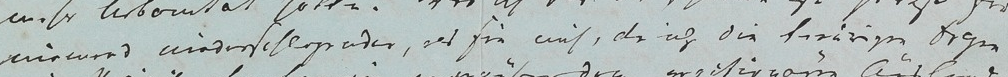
niemand niederschlagender, als für mich, da ich die traurigen Folgen
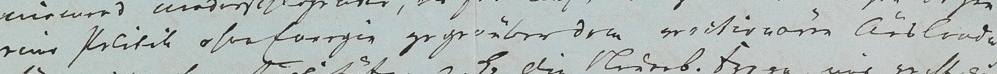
einer Politik ohne Energie gegenüber dem reactionären Auslande
